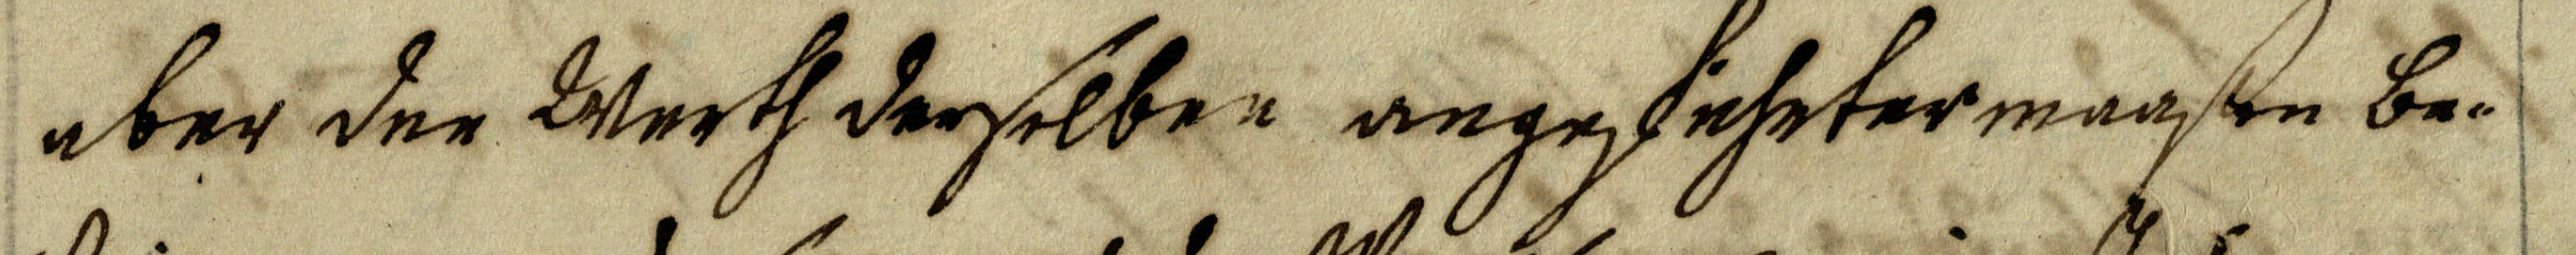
aber den Werth derselben angeführtermaaßen be¬
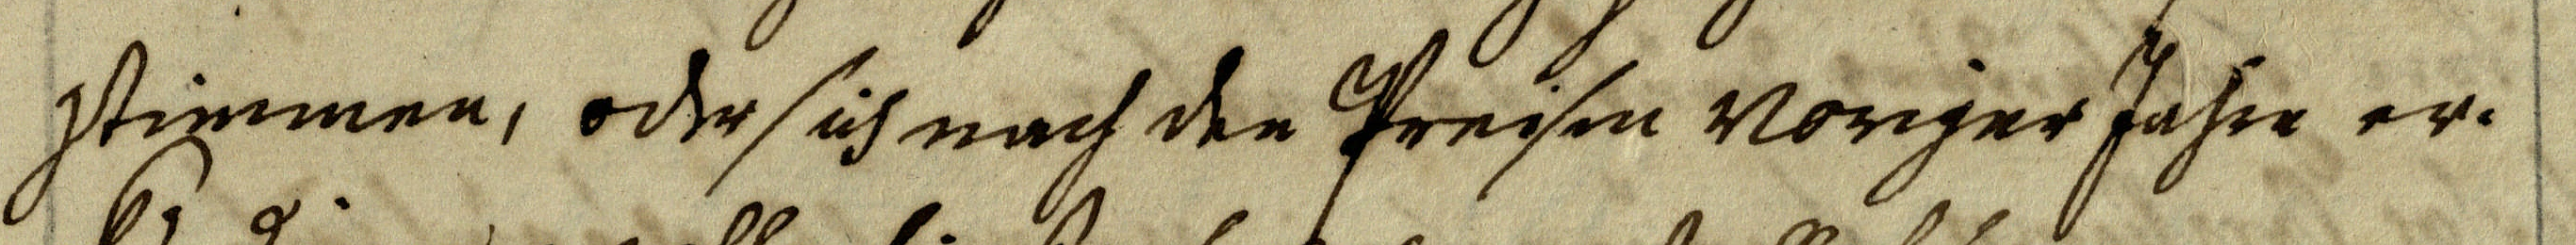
stimmen, oder sich nach den Preisen voriger Jahre er¬
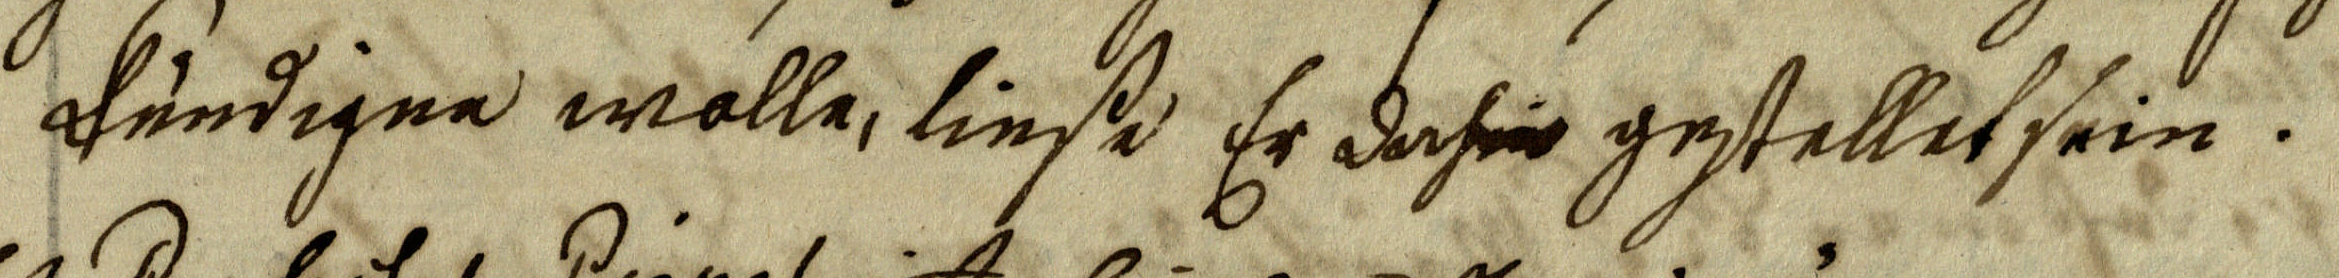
kundigen wolle, ließe Er dahin gestellet sein.
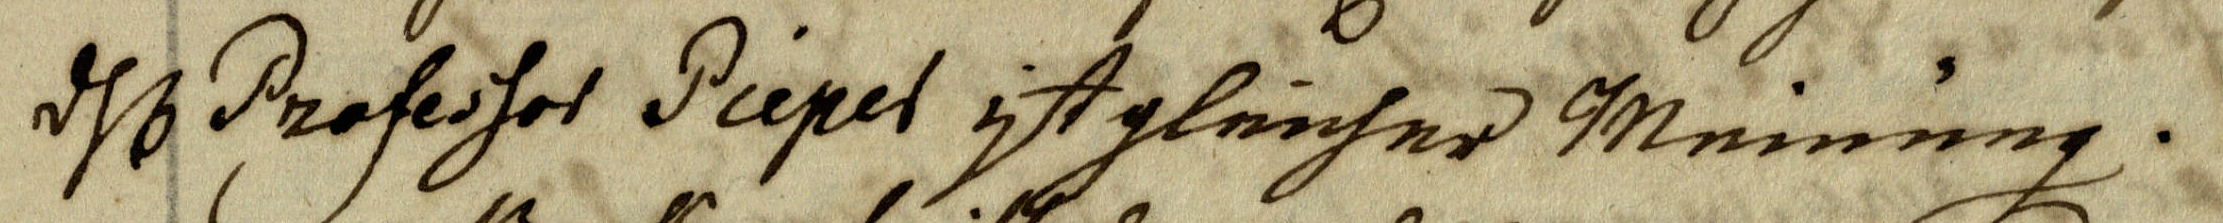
dh. Professor Pieper ist gleicher Meinung.
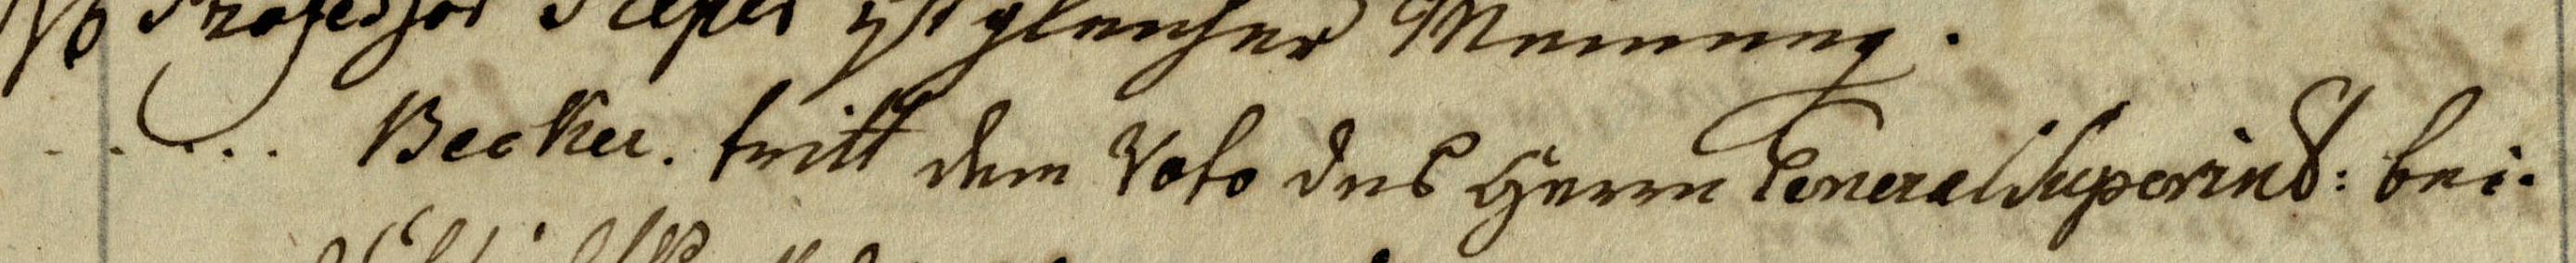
Becker. tritt dem Voto des Herrn GeneralSuperint. bei.
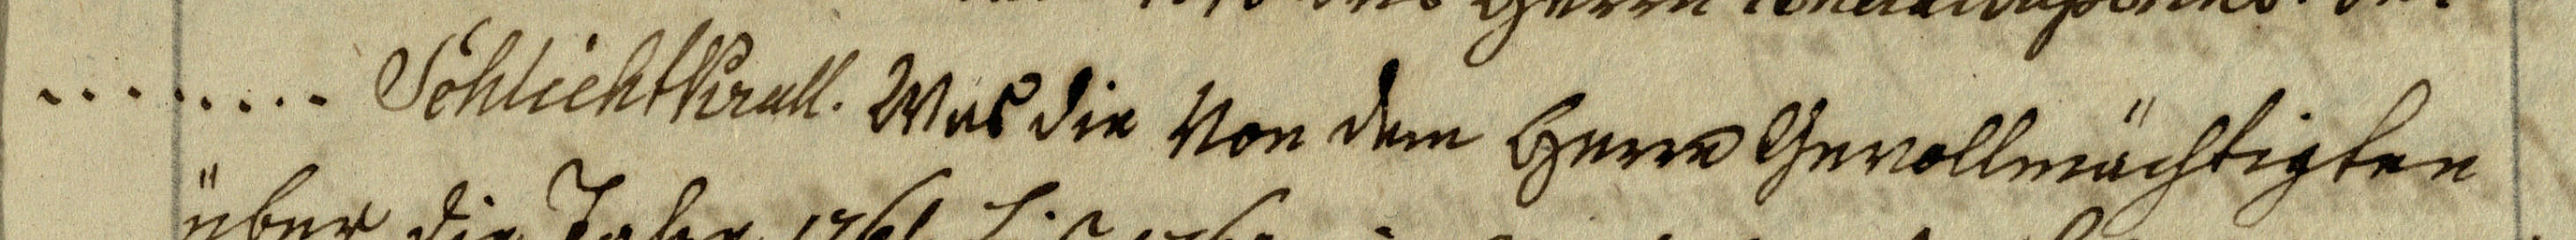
Schlichtkrull. Was die von dem Herrn Gevollmächtigten
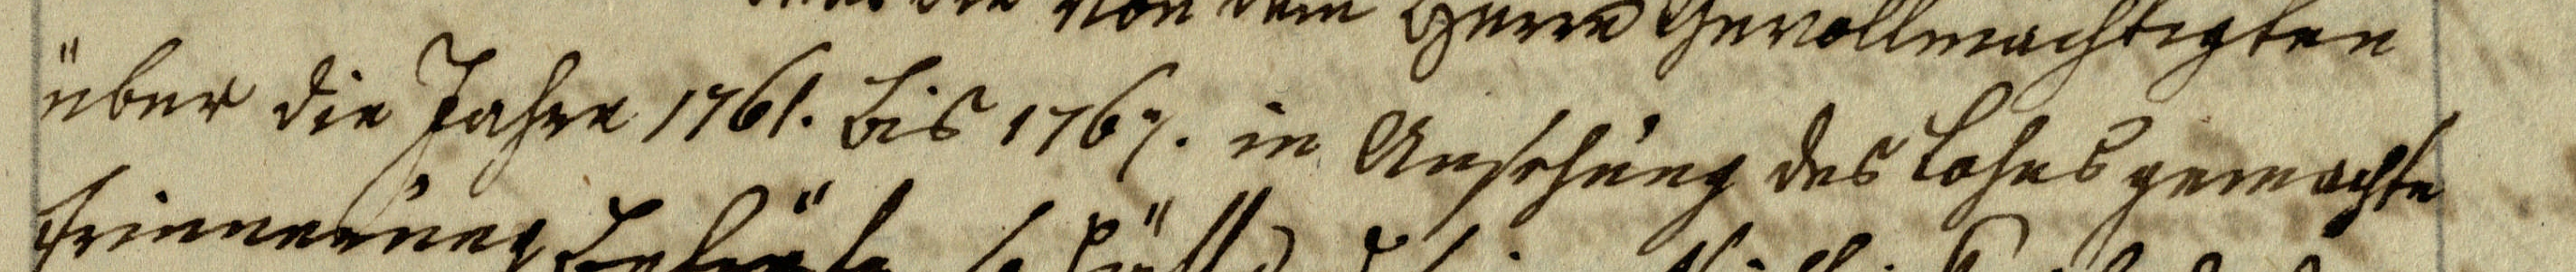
über die Jahre 1761. bis 1767. in Ansehung des Lohns gemachte
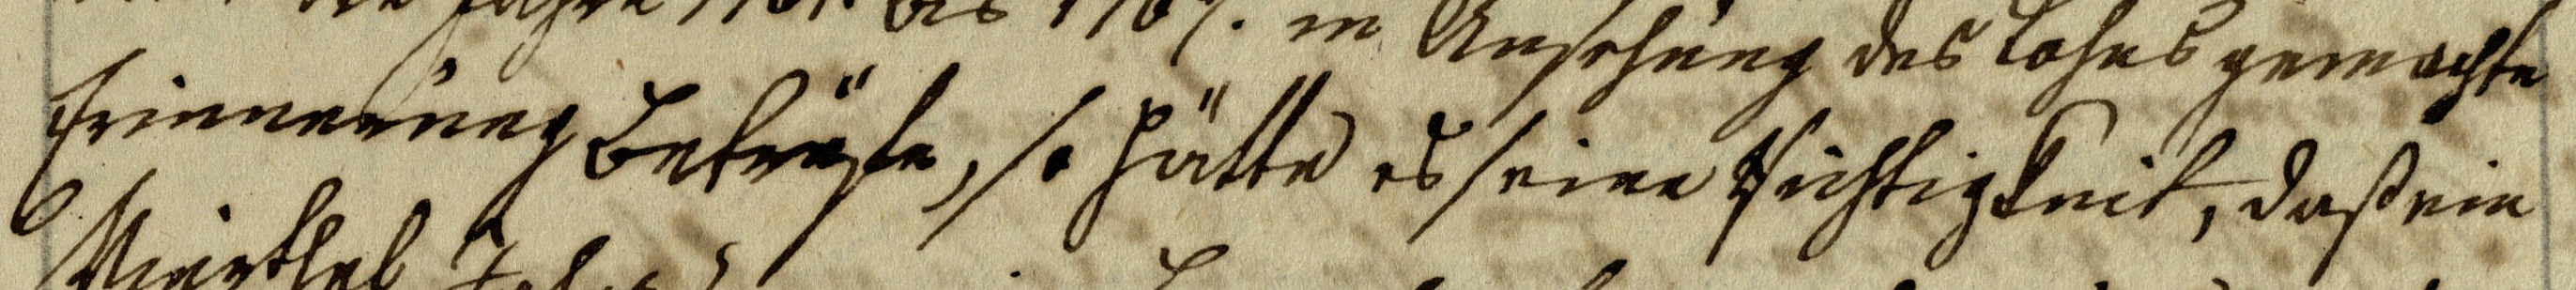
Erinnerung beträfe, so hätte es seine Richtigkeit, daß ein
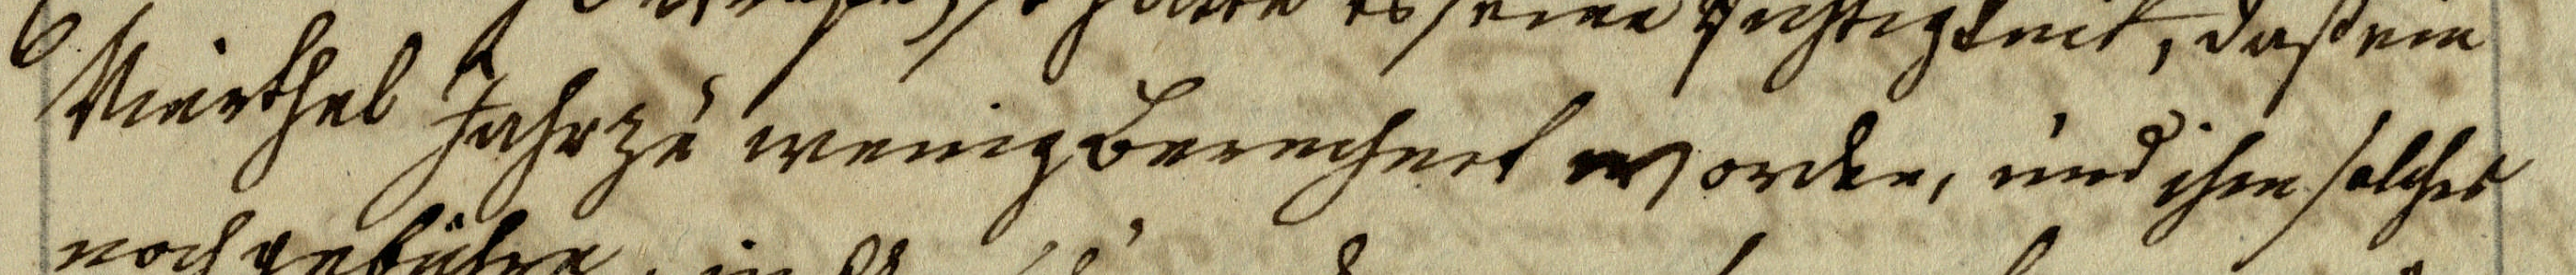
Vierthel Jahr zu wenig berechnet worden, und ihm solches
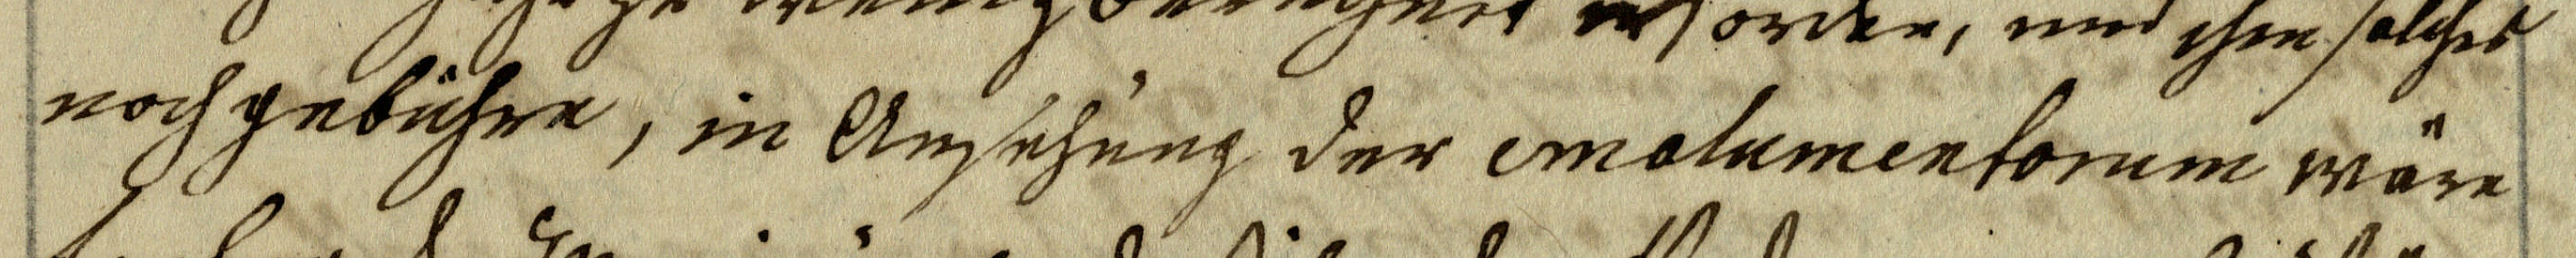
noch gebühre, in Ansehung der emolumentorum wäre
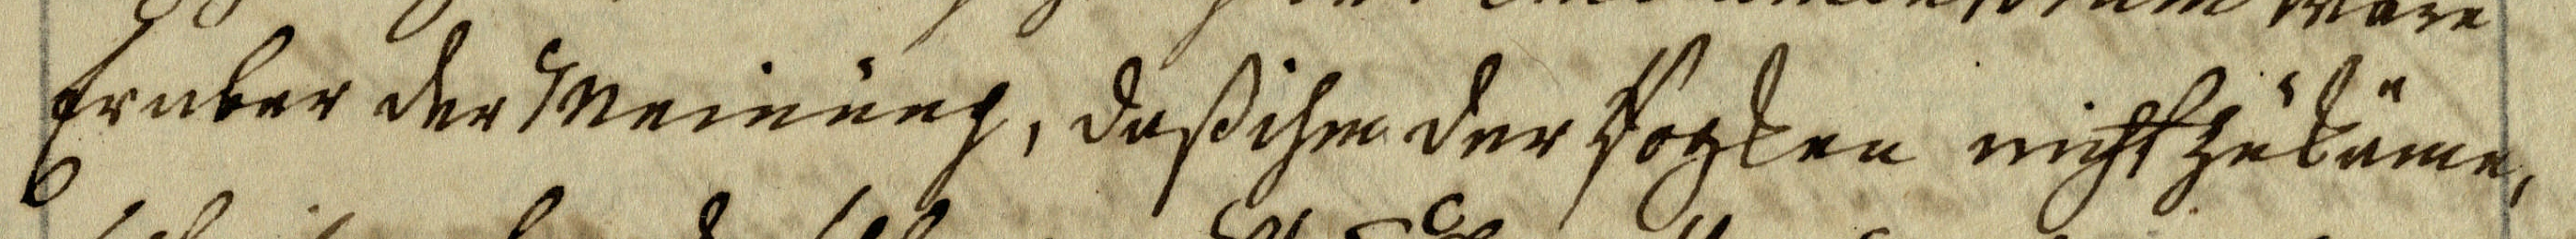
Er aber der Meinung, daß ihm der Rogken nicht zukäme,
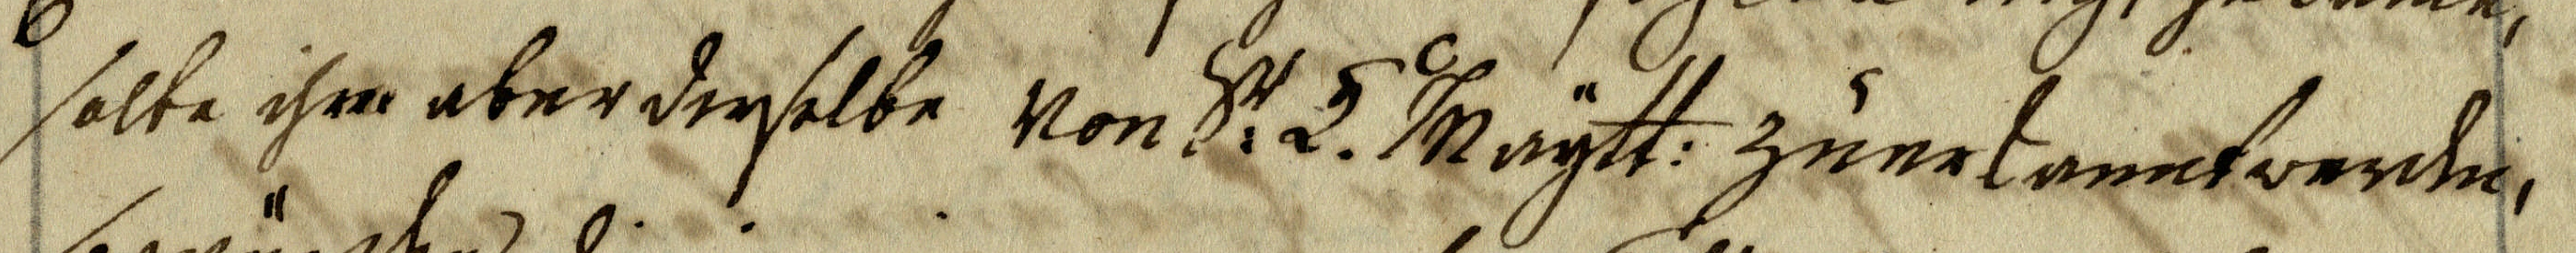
solte ihm aber derselbe von Sr. K. Maÿtt. zuerkannt werden,
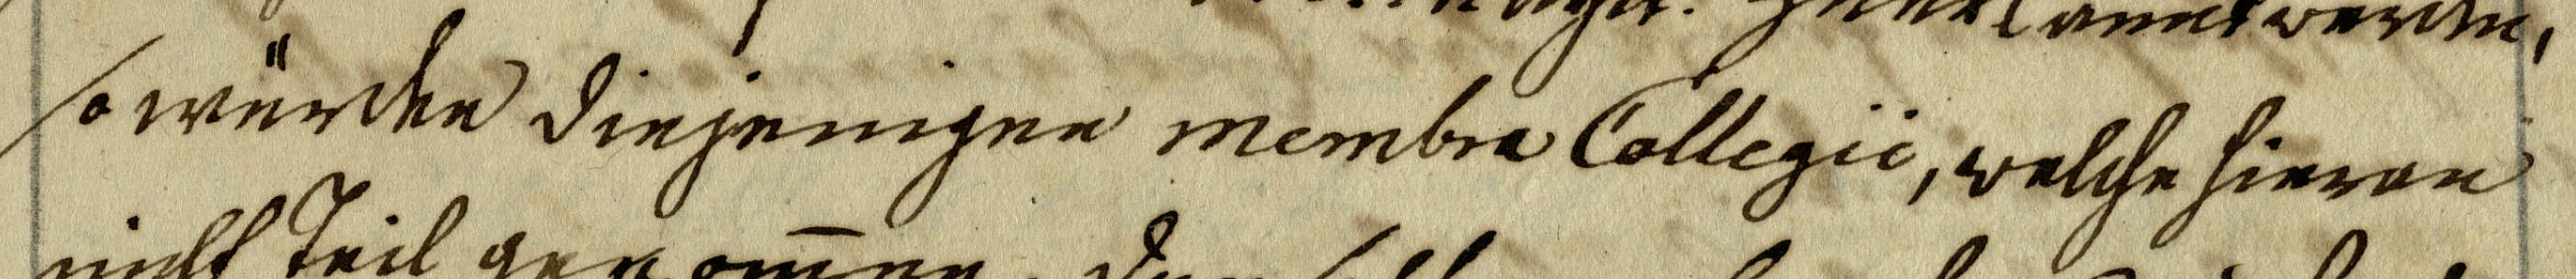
so würden diejenigen membra Collegii, welche hieran
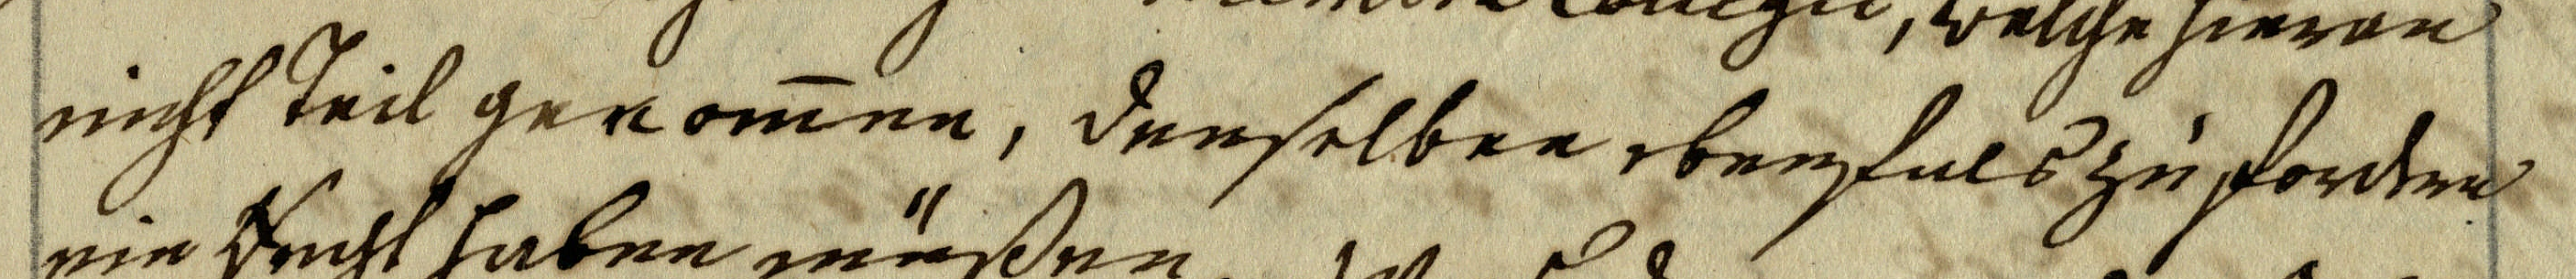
nicht Teil genomen, denselben ebenfals zu fordern
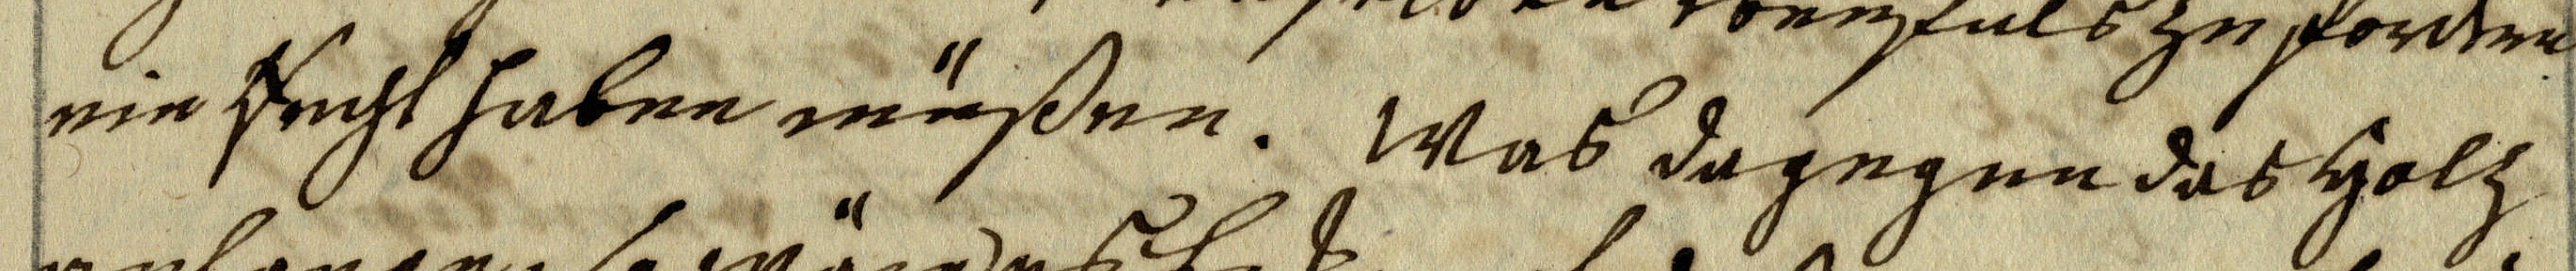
ein Recht haben müßen. Was dagegen das Holz
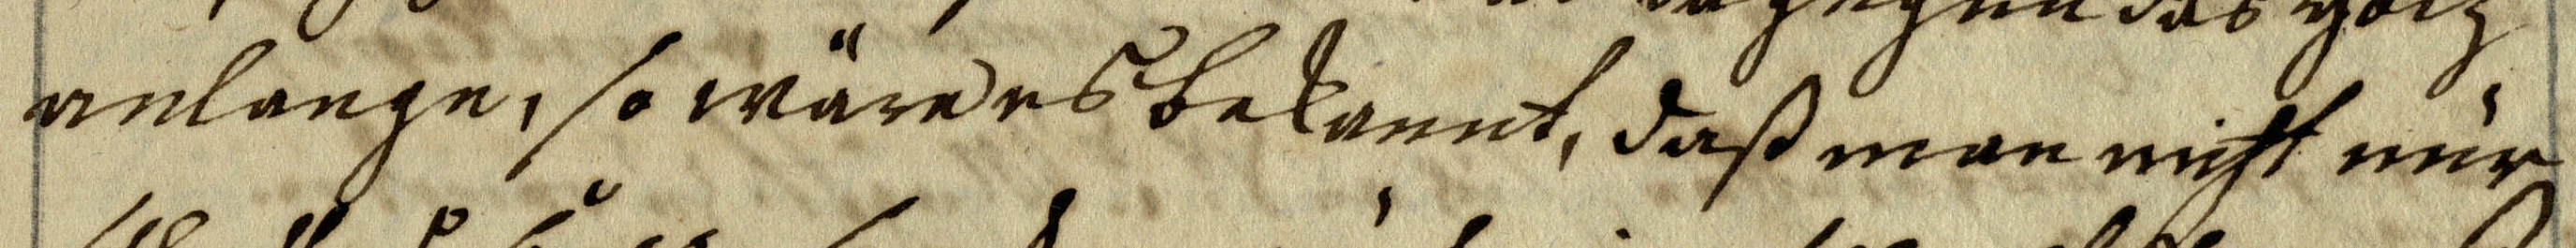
anlange, so wäre es bekannt, daß man nicht nur
